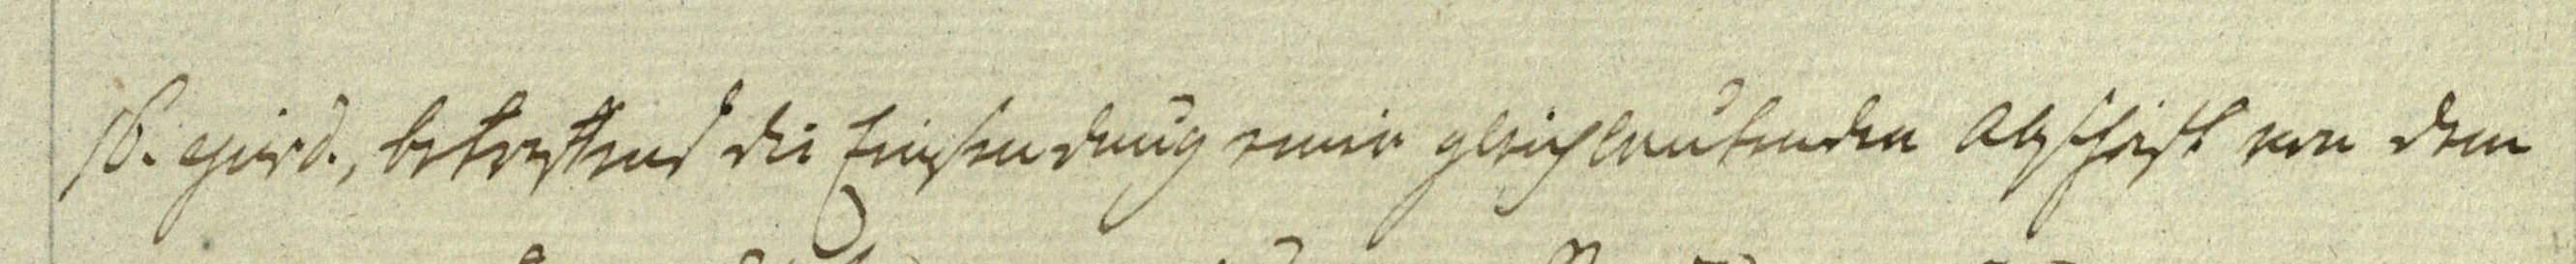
16. ejusd., betreffend die Einsendung einer gleichlautenden Abschrift von dem
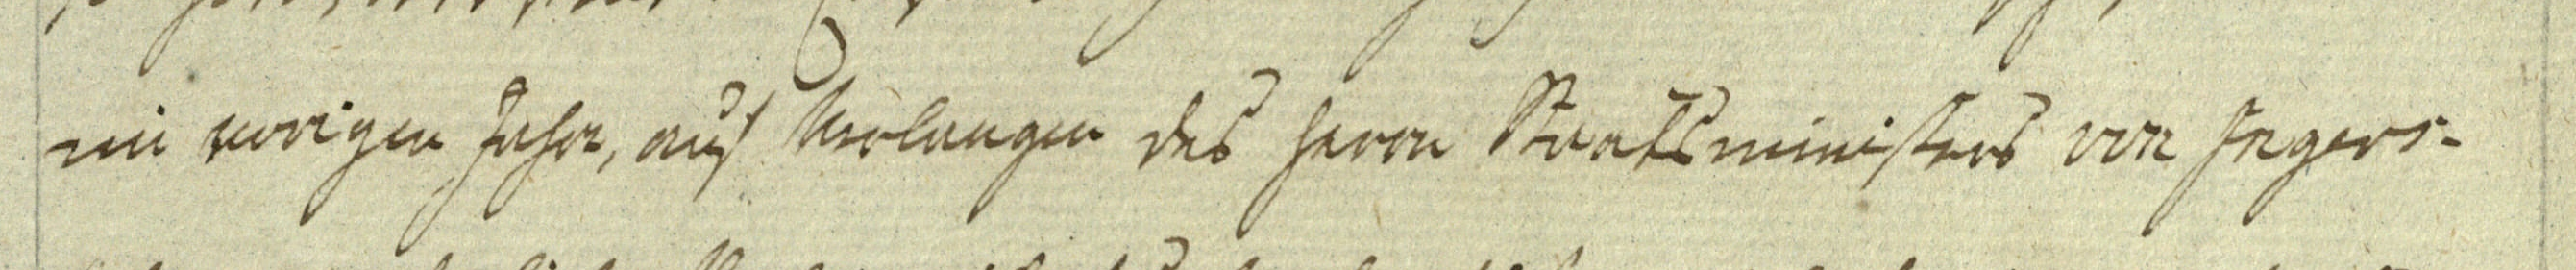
im vorigen Jahre, auf Verlangen des Herrn Staatsministers von Ingers¬
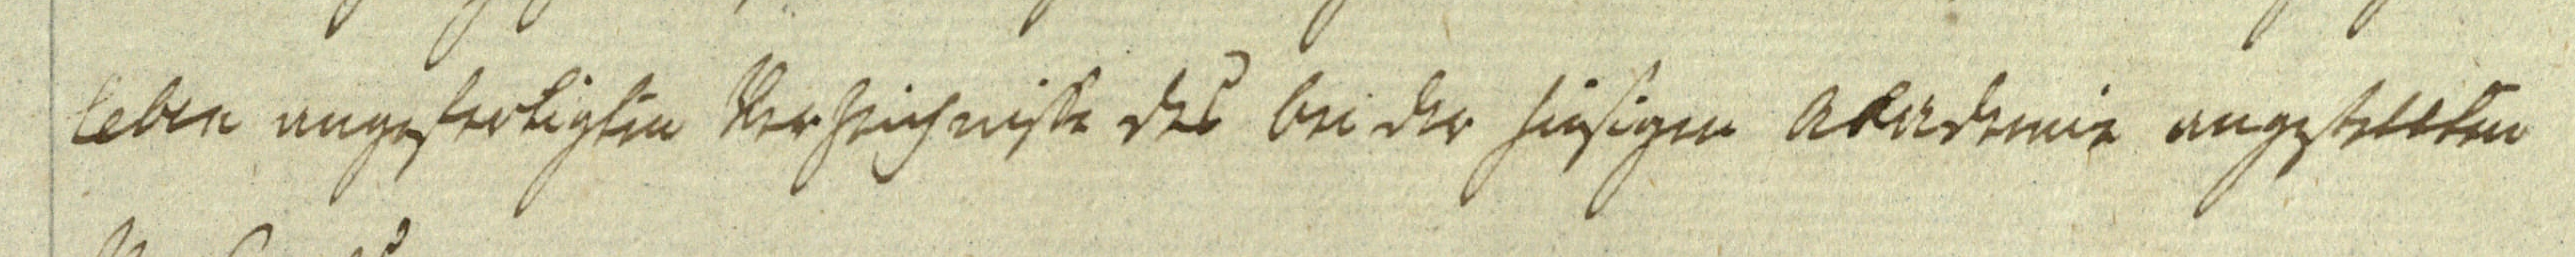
leben angefertigten Verzeichnisse des bei der hiesigen Akademie angestellten
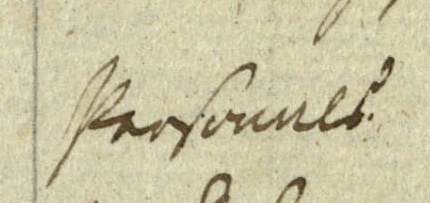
Personals.
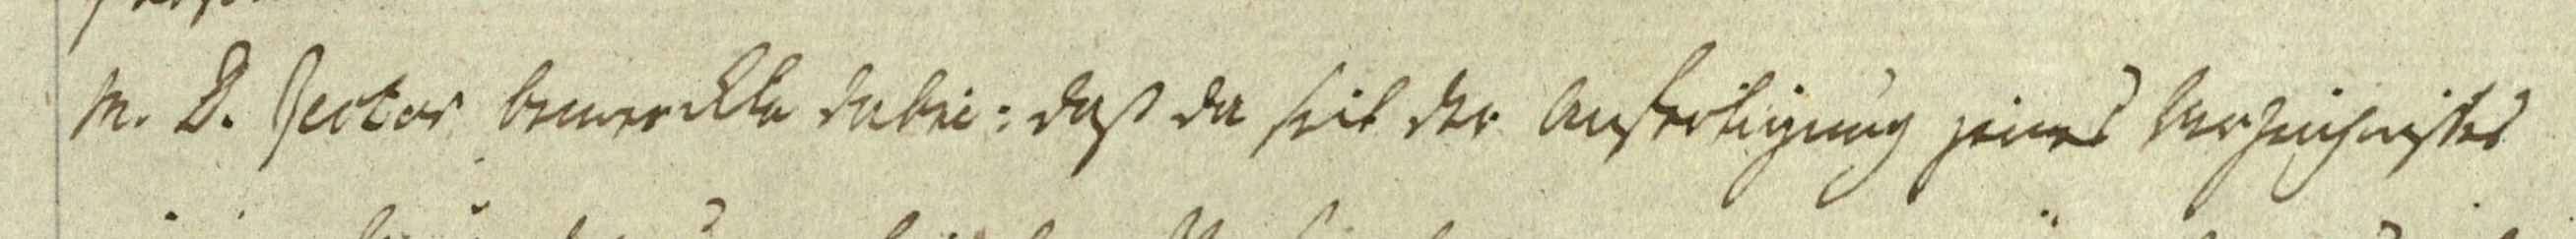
M. D. Rector bemerckte dabei: daß da seit der Anfertigung seines Verzeichnisses
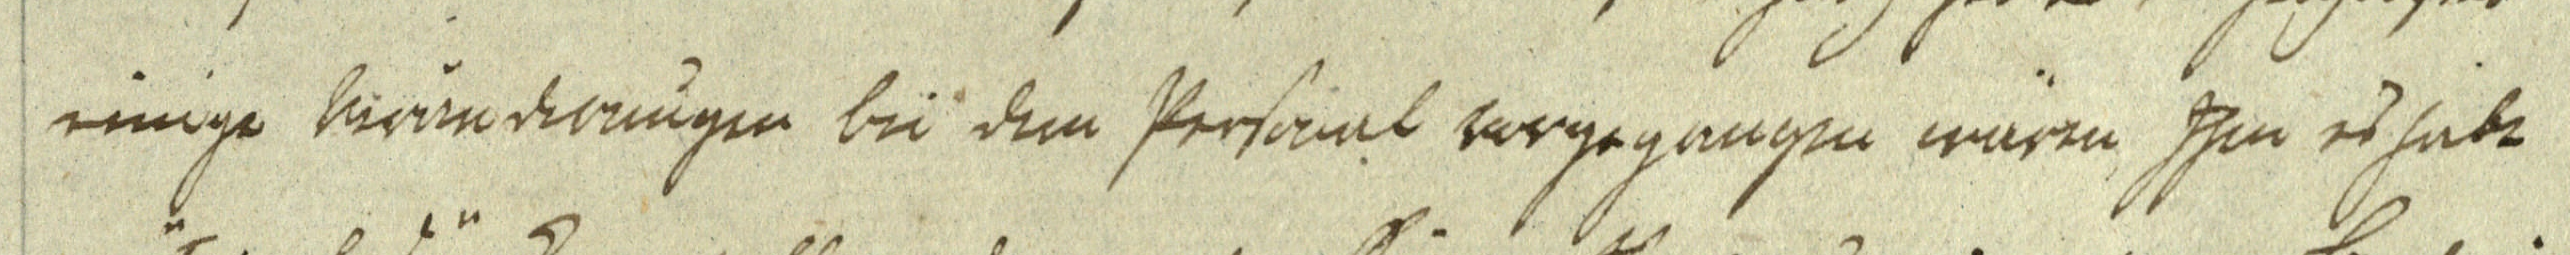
einige Veränderungen bei dem Personal vorgegangen wären, Ihm es habe
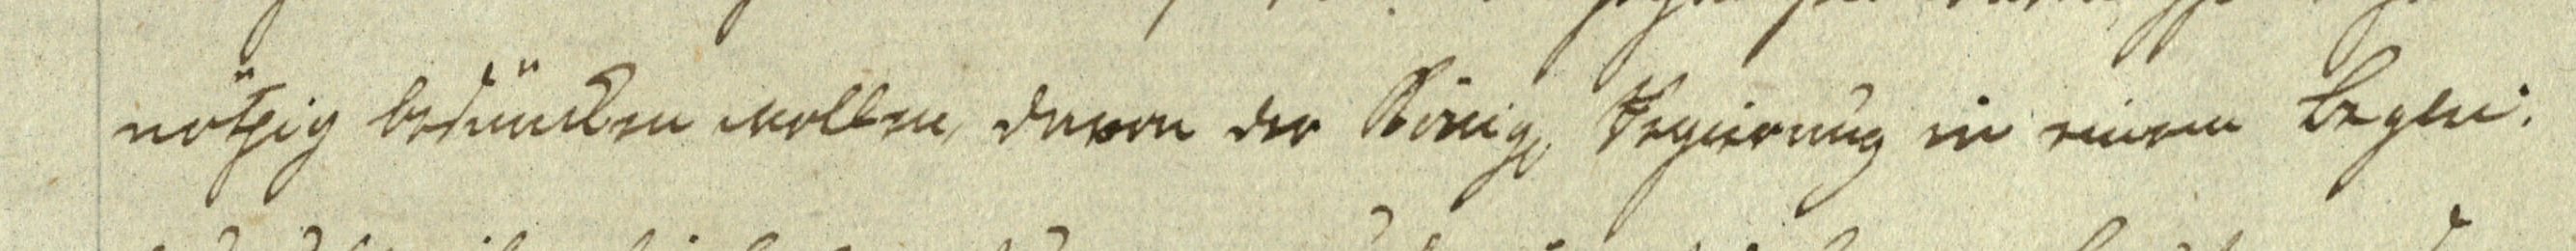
nöthig bedüncken wollen, davon der Königl Regierung in einem Beglei¬
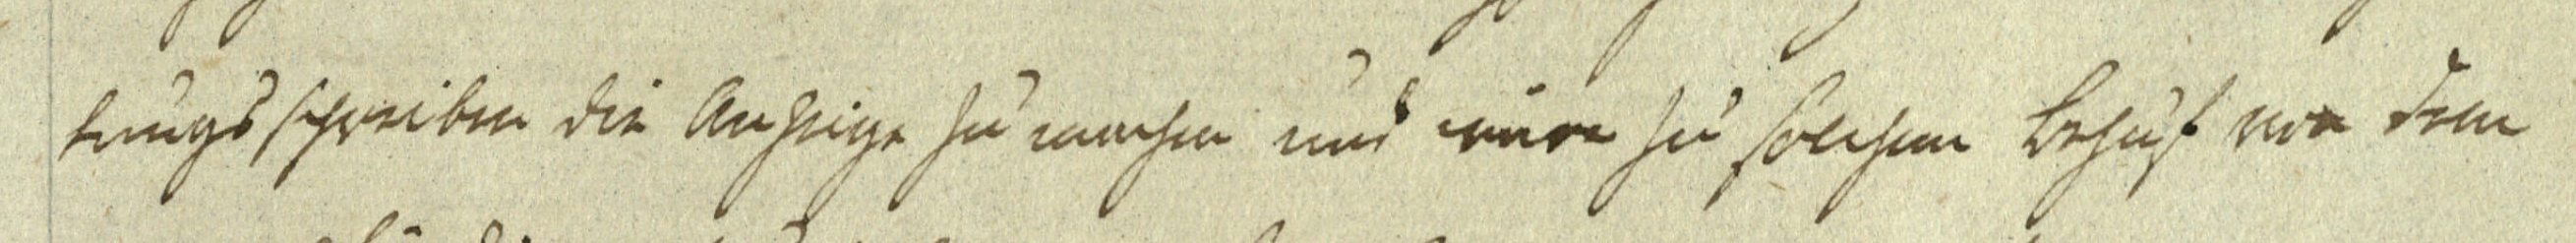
tungsschreiben die Anzeige zu machen und wären zu solchem Behuf von dem
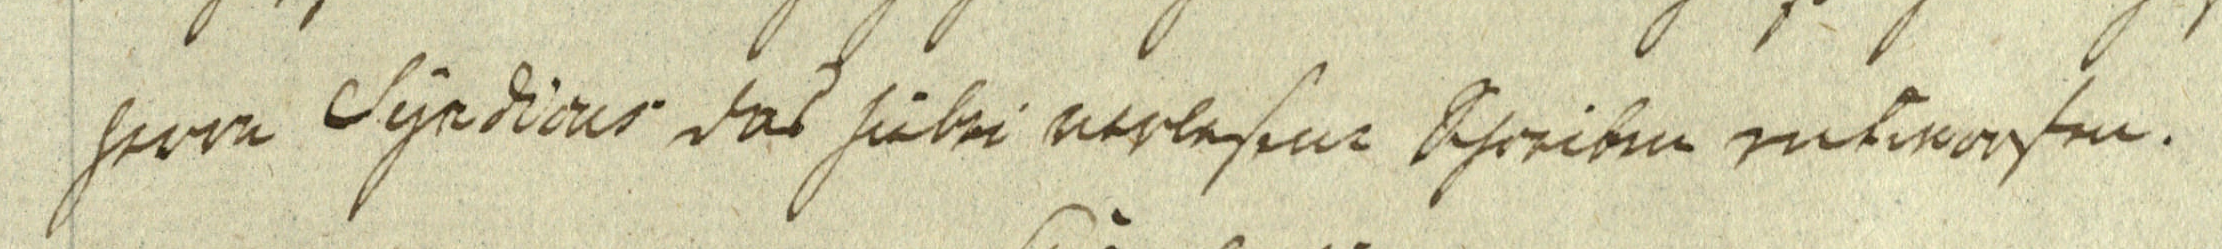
Herrn Sÿndicus das hiebei verlesene Schreiben entworfen.
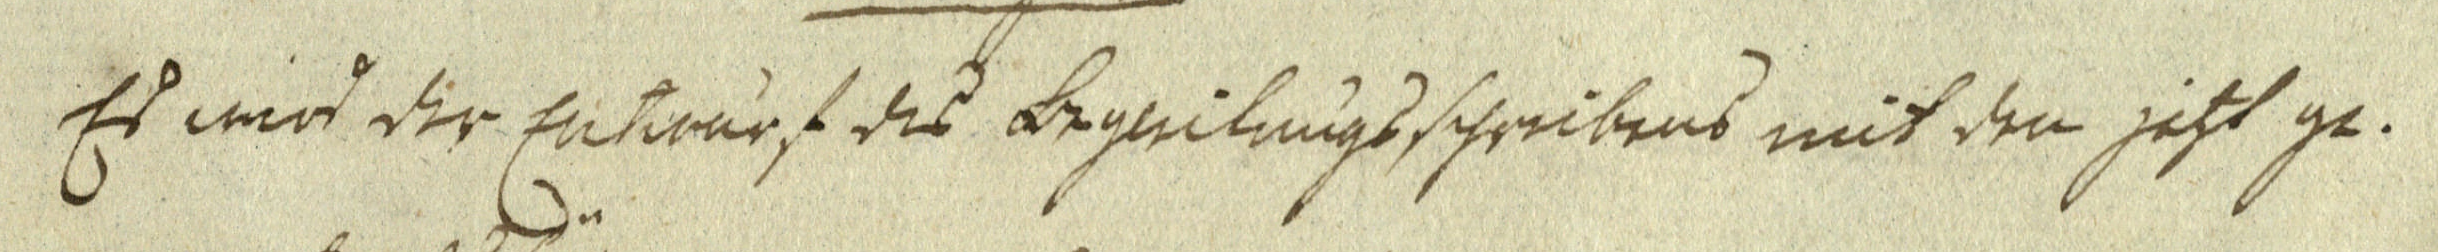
Es wird der Entwurf des Begleitungsschreibens mit dem jetzt ge¬
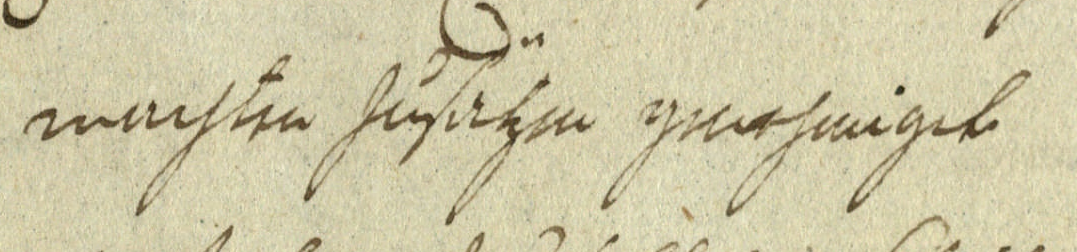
machten Zusätzen genehmiget.
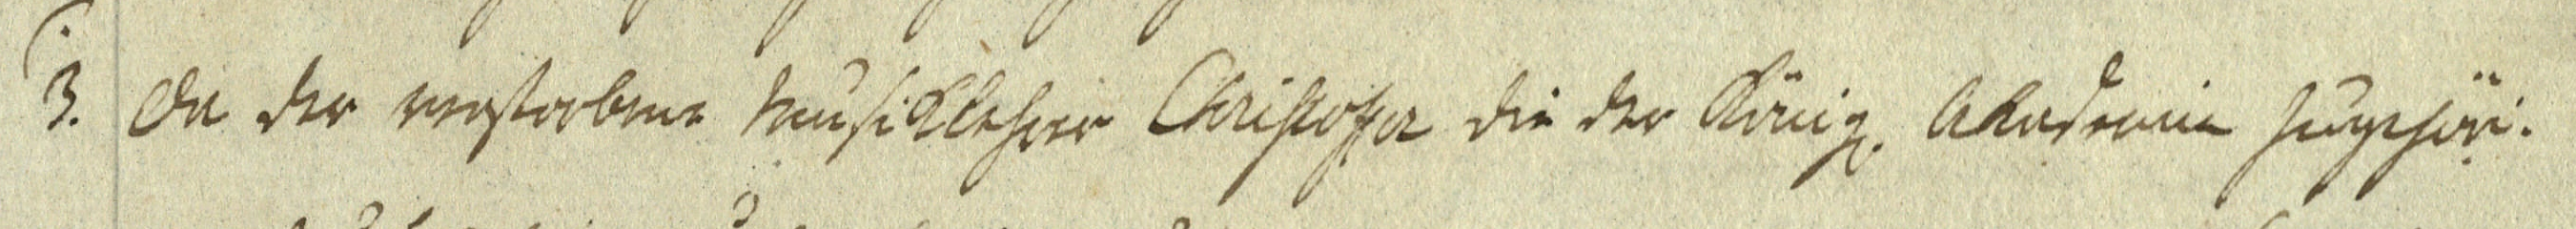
3. Da der verstorbene Musiklehrer Christopher die der Königl. Akademie zugehöri¬
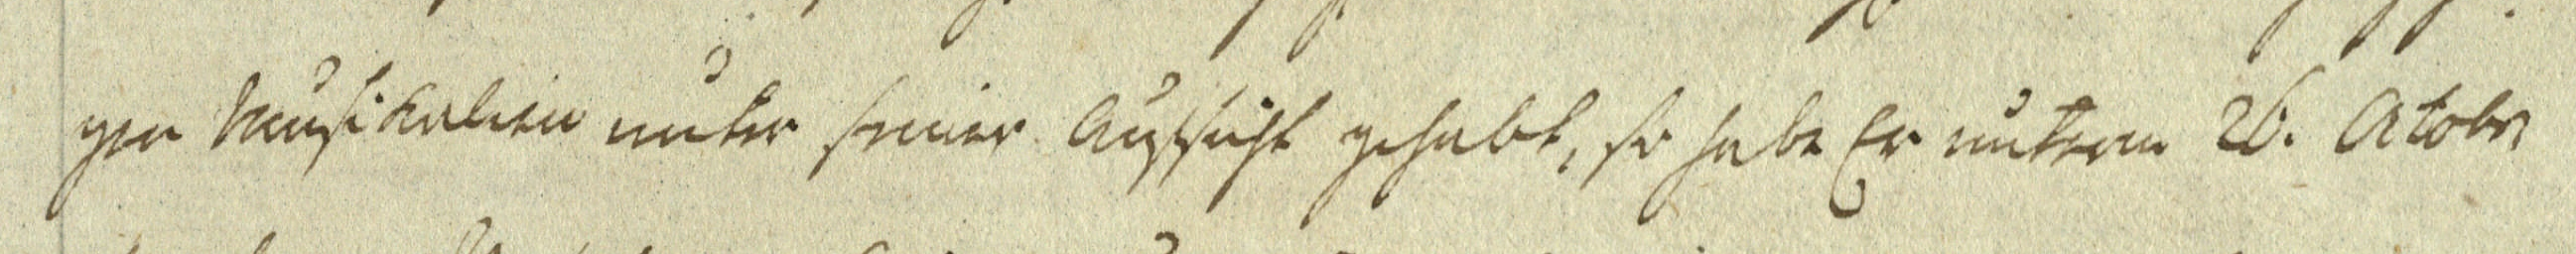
gen Mausikalien unter seiner Aufsicht gehabt, so habe Er unterm 26. Octobr.
